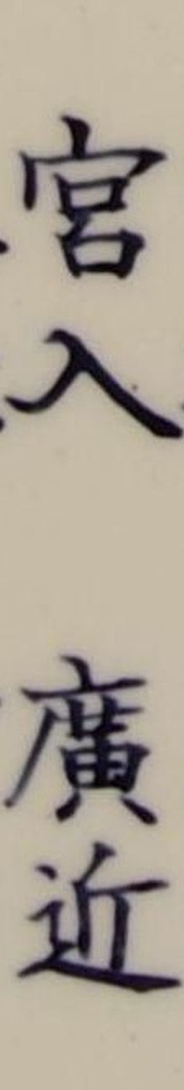宮入広近
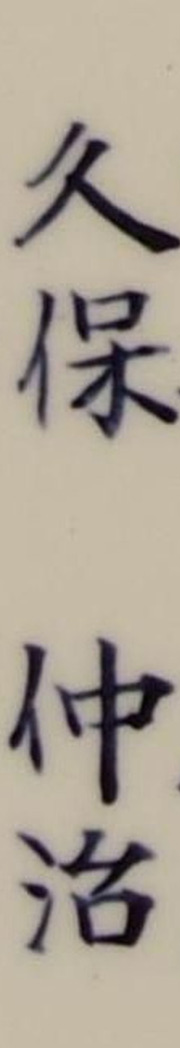久保仲治
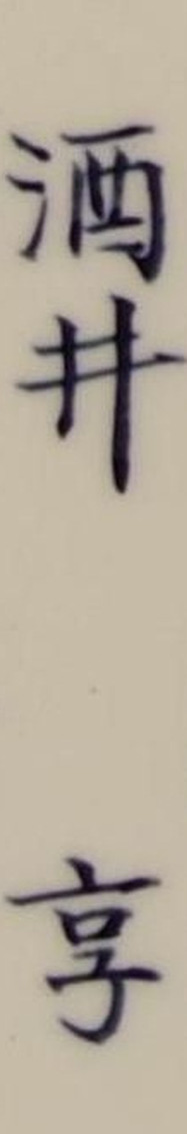酒井享
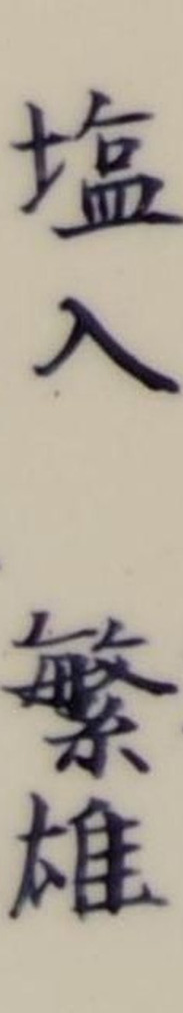塩入繁雄
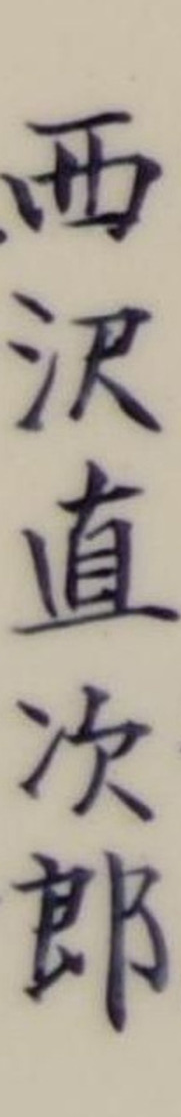西沢直次郎
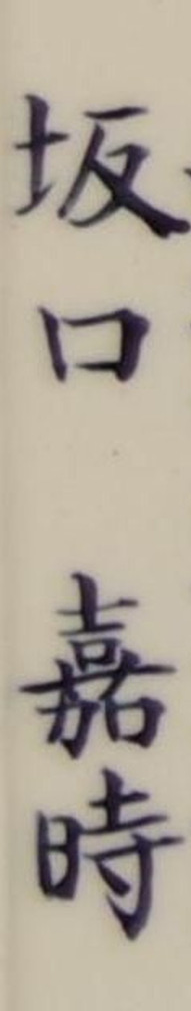坂口嘉時

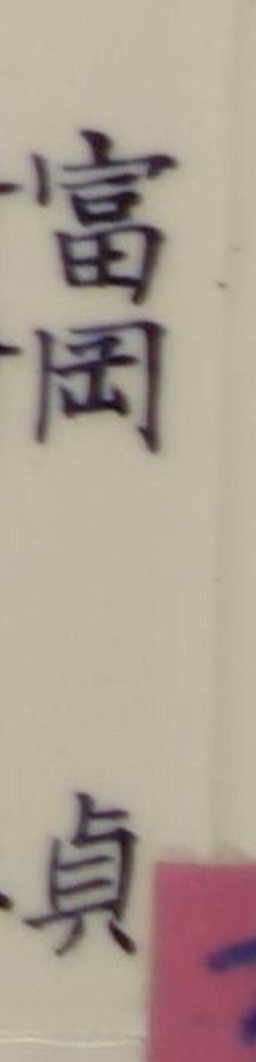富岡貞
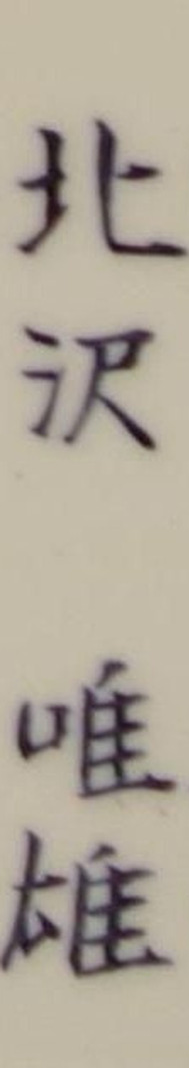北沢唯雄
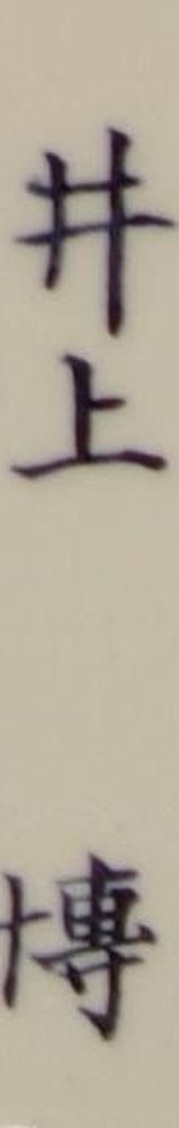井上博
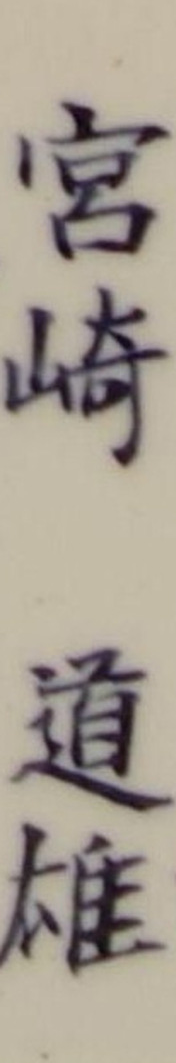宮崎道雄
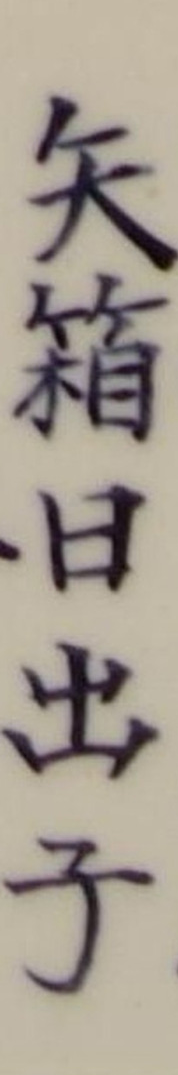矢箱日出子
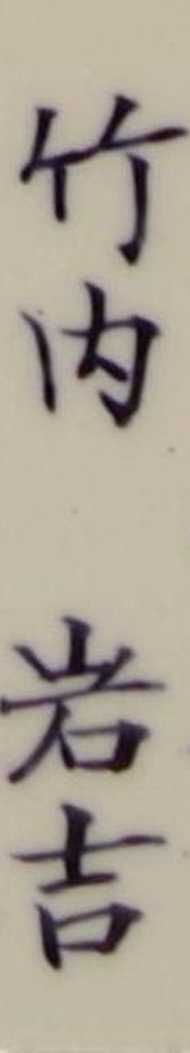竹内岩吉
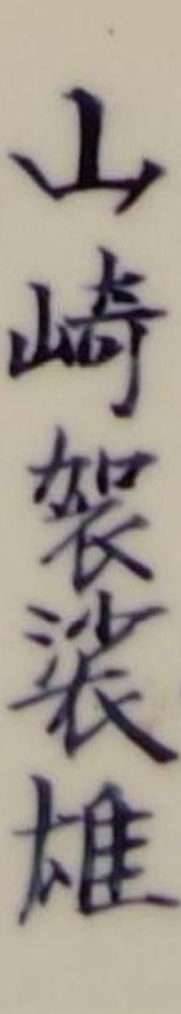山崎袈裟雄
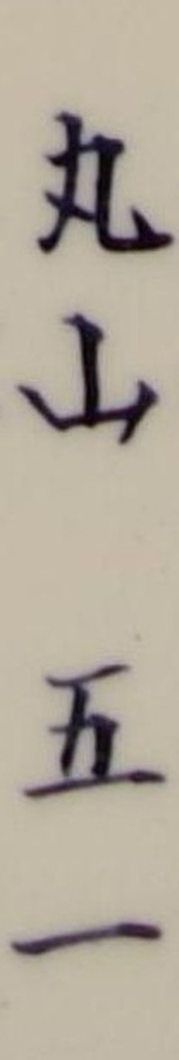丸山五一
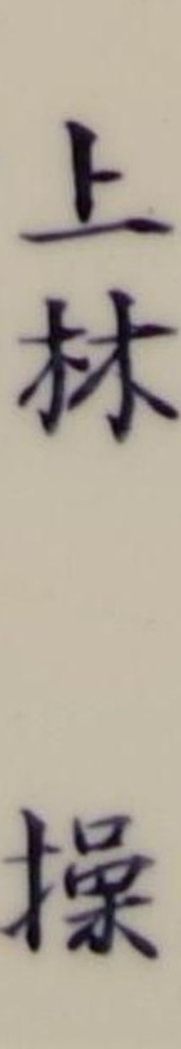上林操
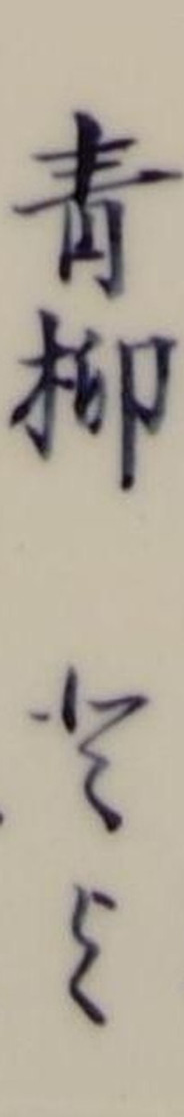青柳とよ
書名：E~L
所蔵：高野山金剛峯寺
